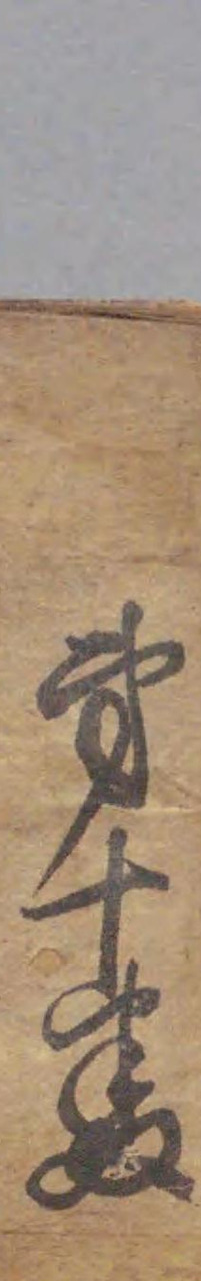第十番
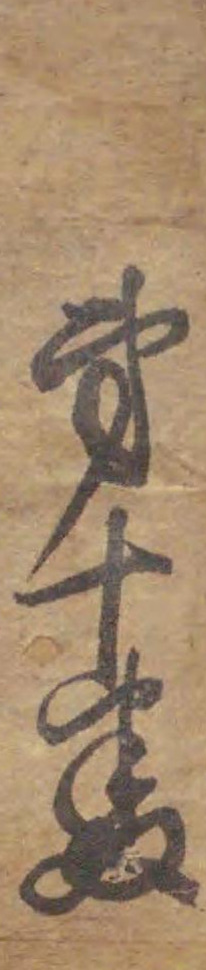第十番

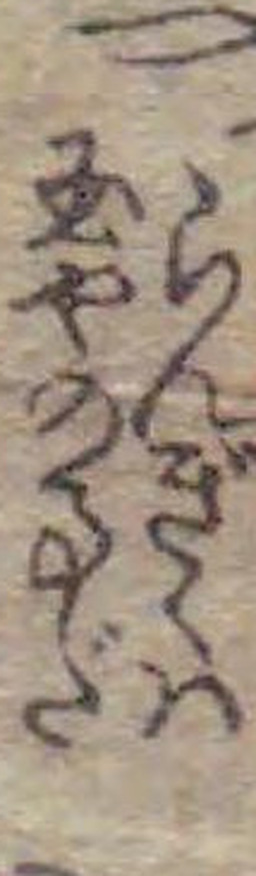玉やの事だ
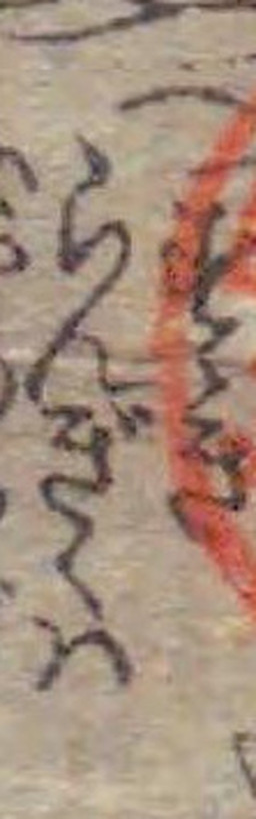らんぎくは
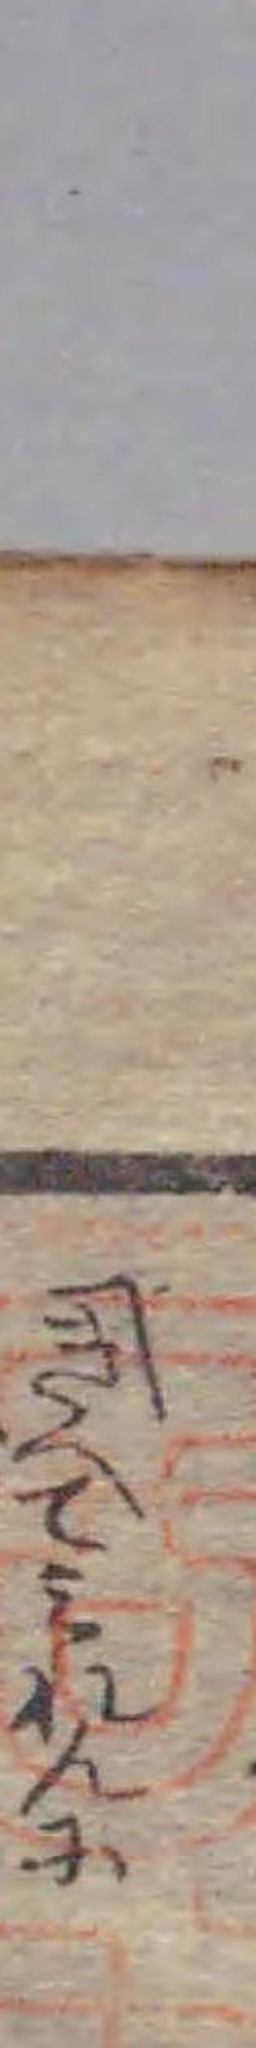〽きへてみれんに
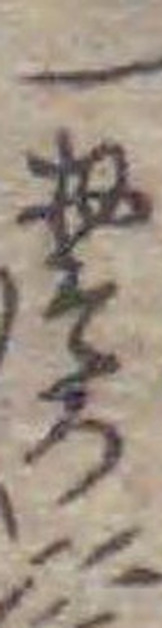おそろ
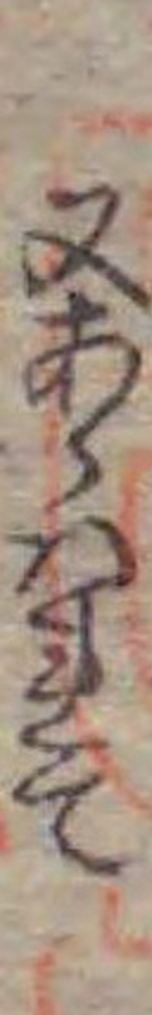又あらはれて
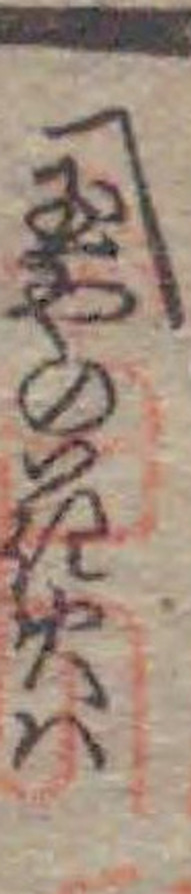〽玉やの花火は
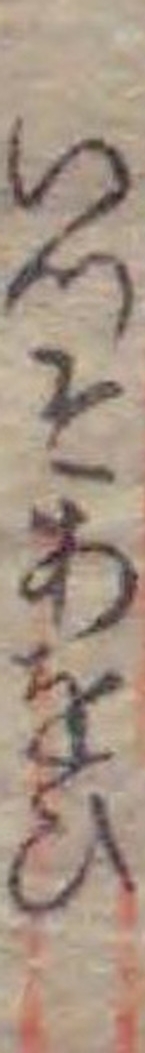いつそあをひ
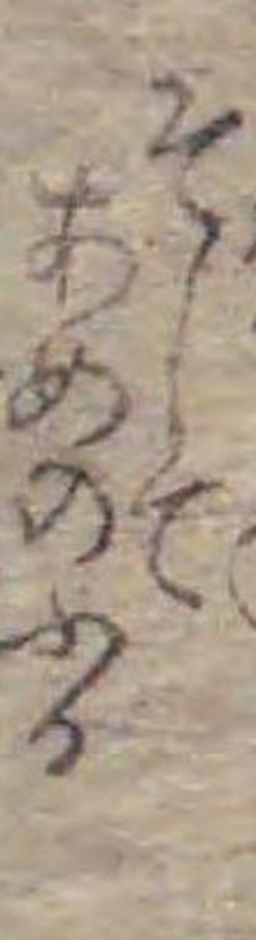あめのふる
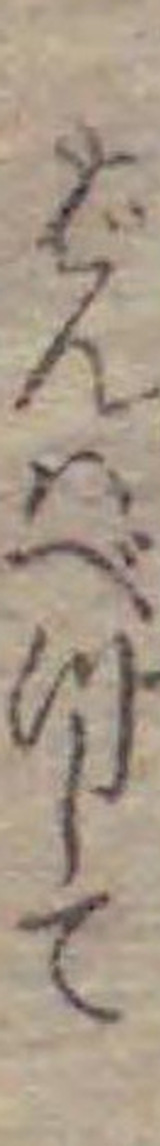ばんはべつして
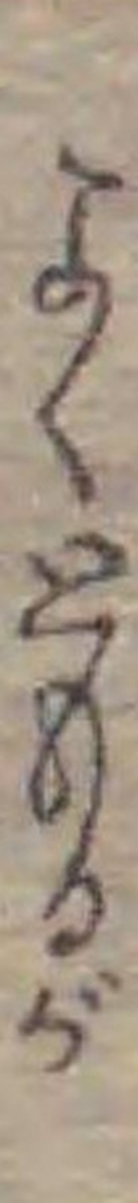よくともるが
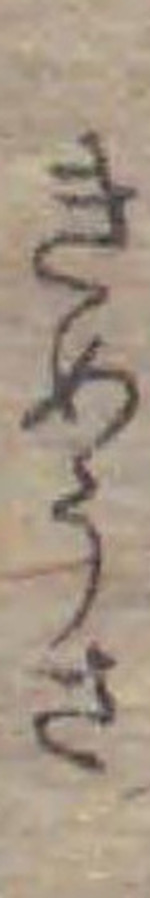きめうさ

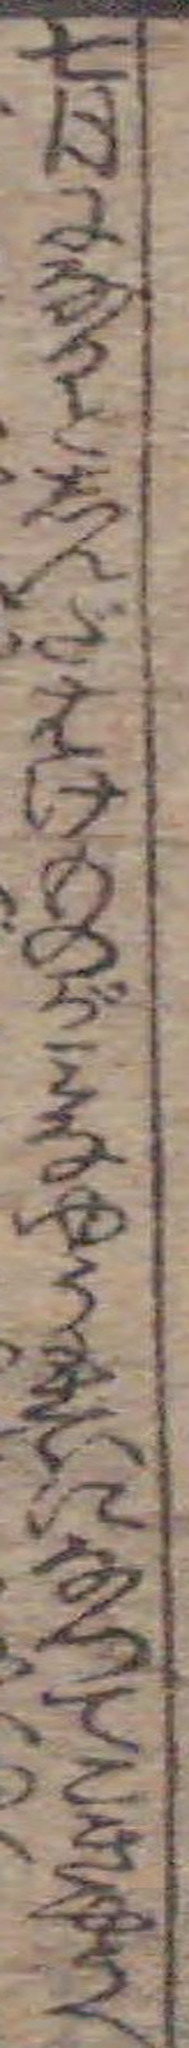七月になるとしんだはけものがみなゆうれいになつてこきやうへ
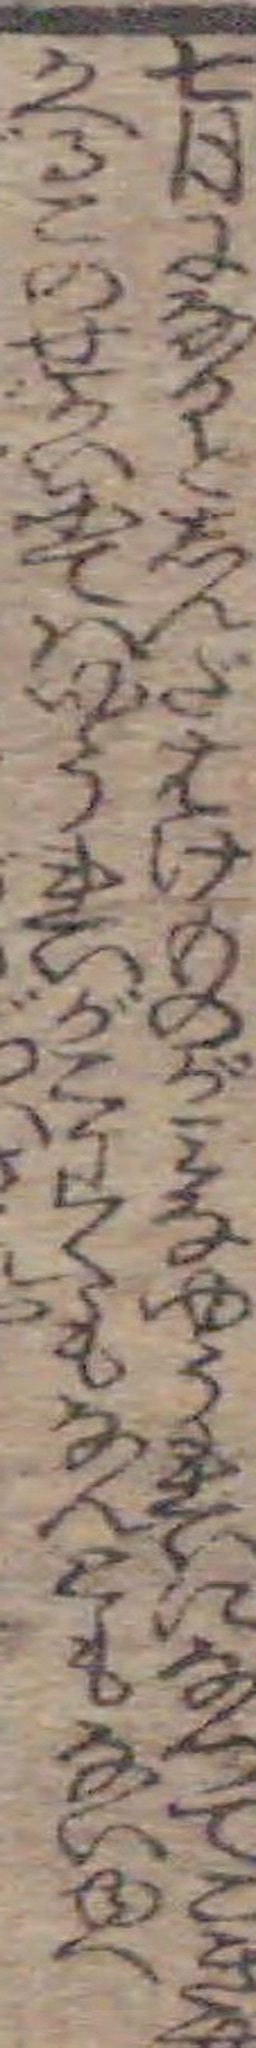かへるこのせかいにてはゆうれいがこわくもなんともないゆへ
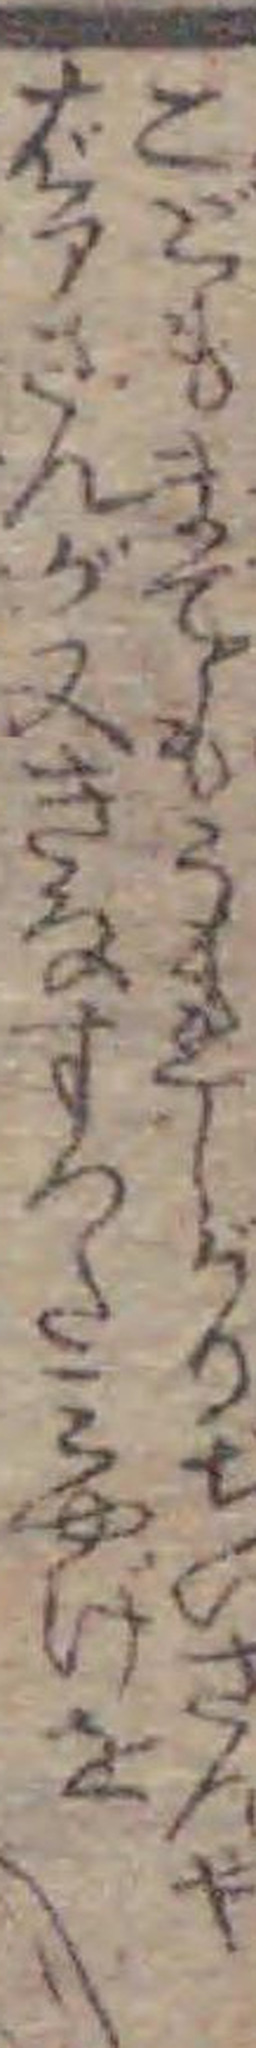ばアさんが又きなすつたみやげを
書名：年中行状記 : 2巻
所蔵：国立国会図書館 National Diet Library, JAPAN
